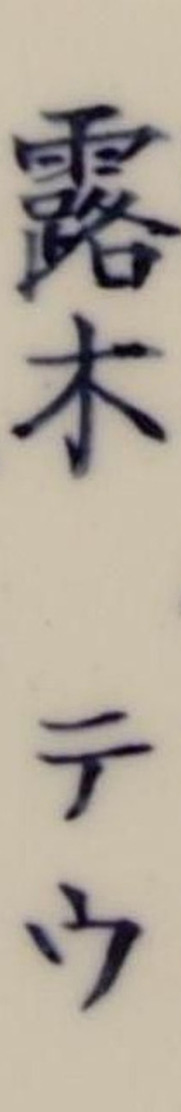露木テウ
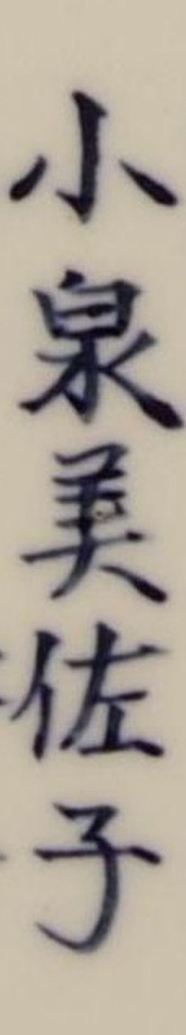小泉美佐子
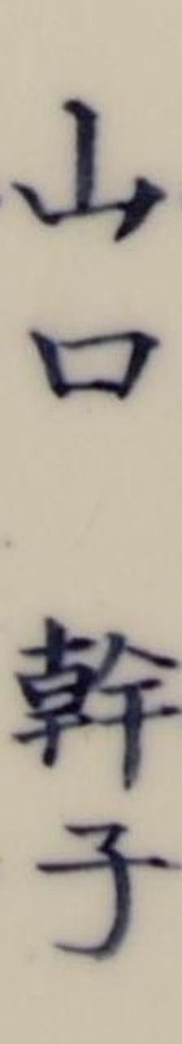山口幹子
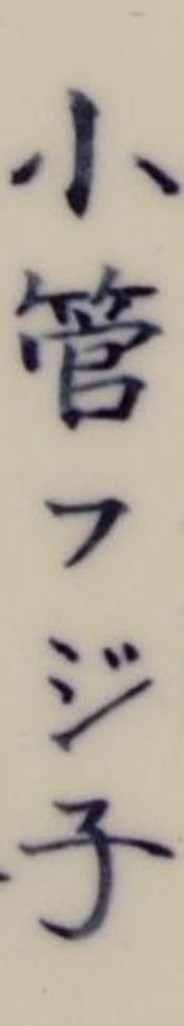小管フジ子
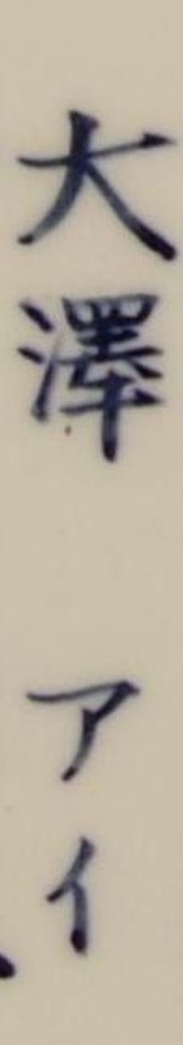大澤アイ
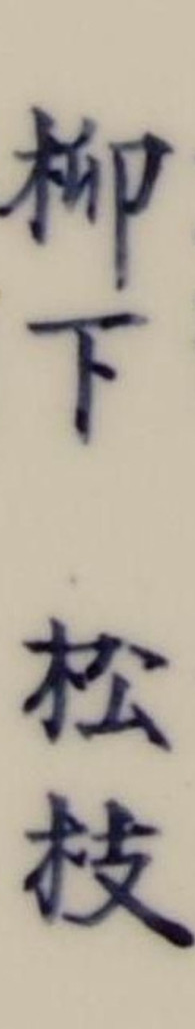柳下松枝
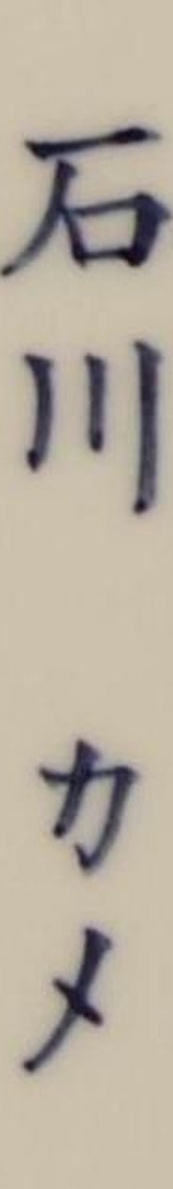石川カメ
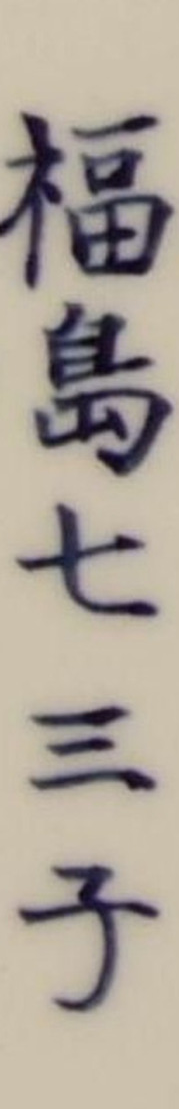福島七三子
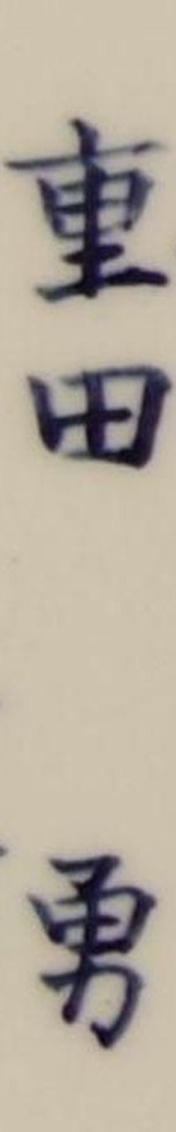重田勇

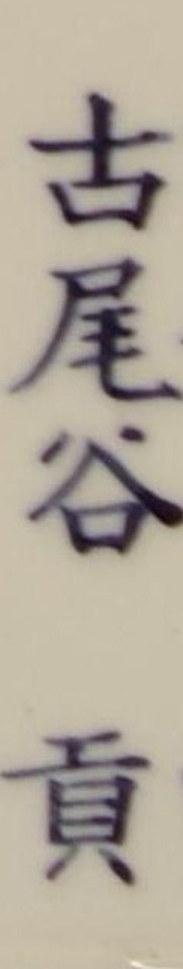古尾谷貢
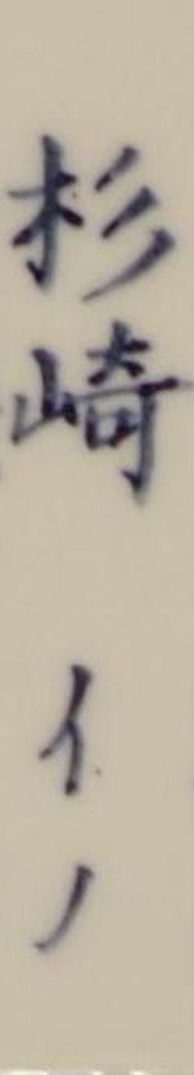杉崎イノ
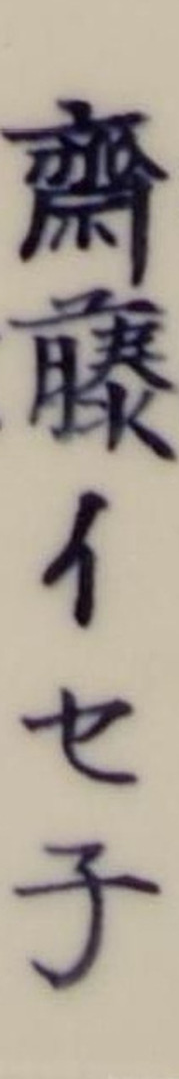斎藤イセ子
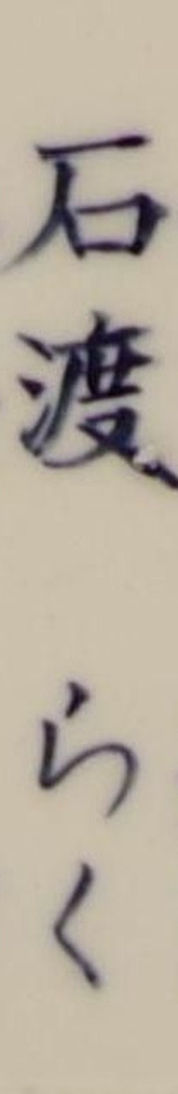石渡らく
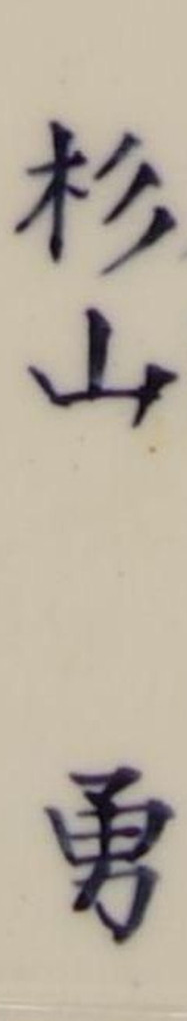杉山勇
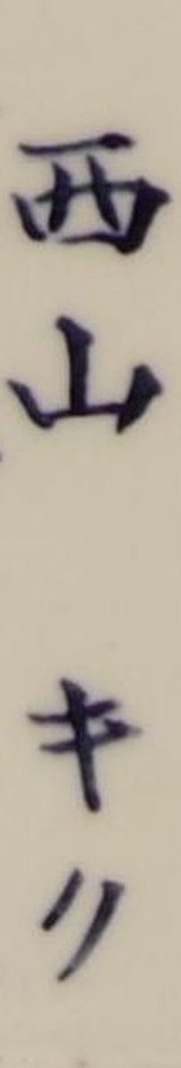西山キク

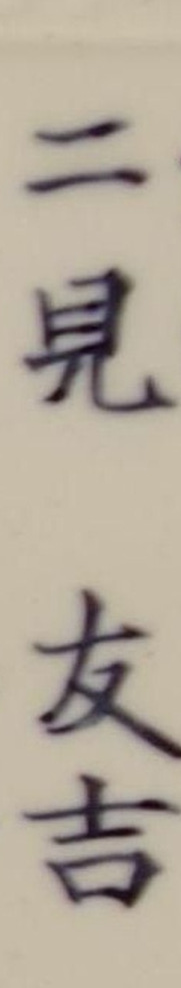二見友吉
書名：M~S
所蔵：高野山金剛峯寺
